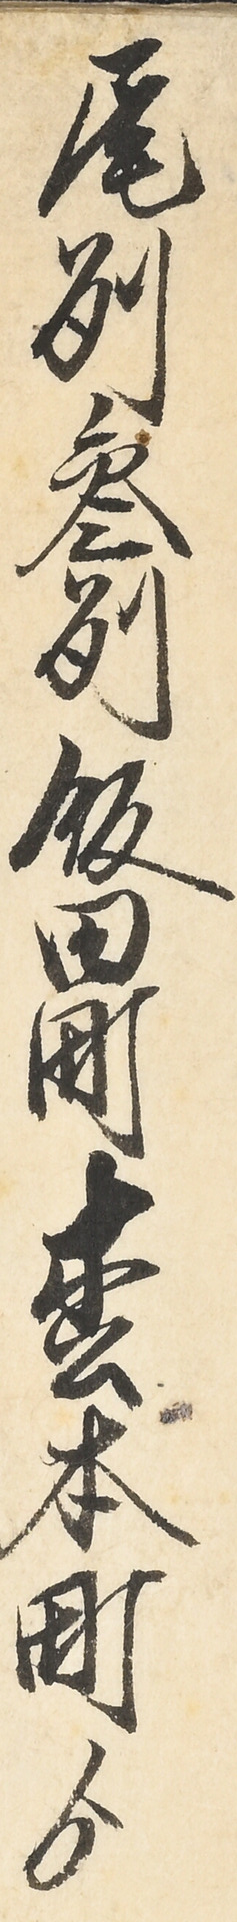尾州三州飯田町松本町ゟ
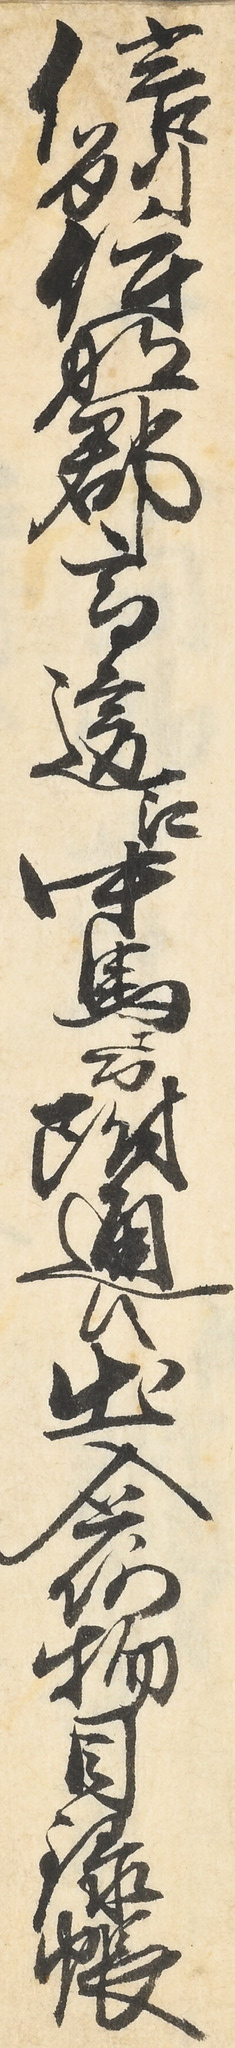信州伊那郡高遠江中馬ニ而附通候出入荷物目録帳

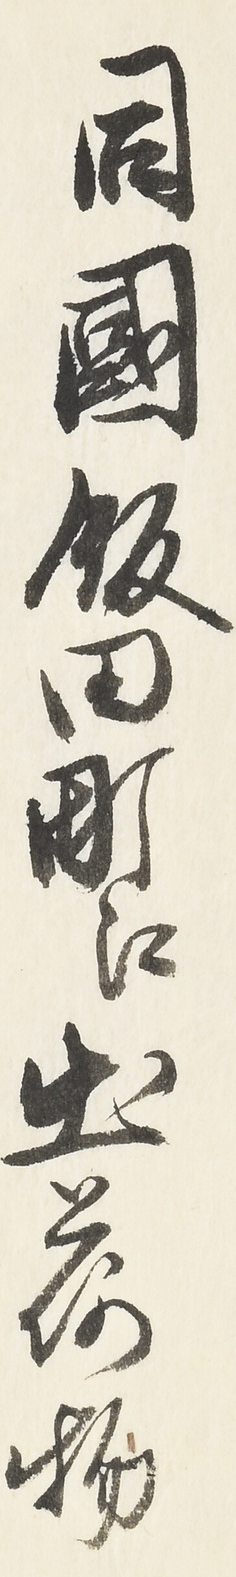同国飯田町江出荷物
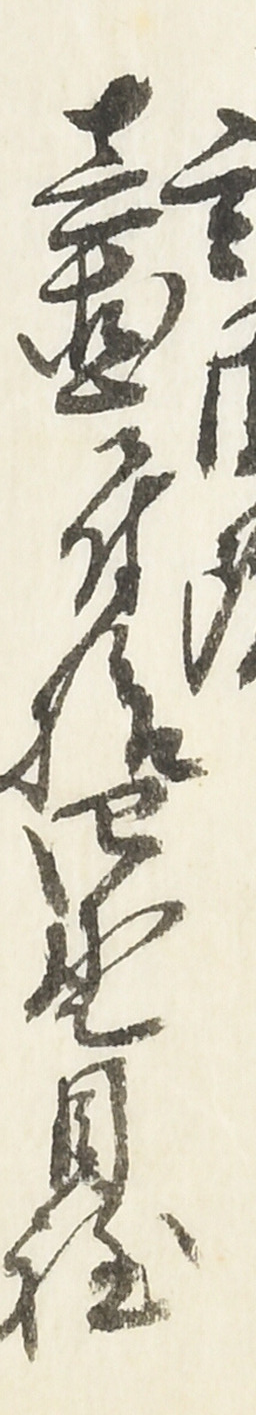壱固ニ付拾四貫目程
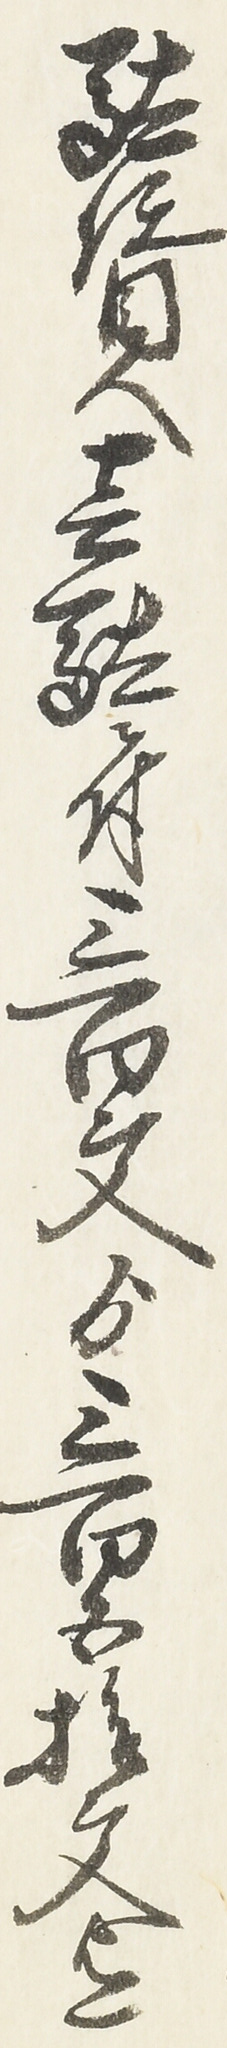駄賃壱駄ニ付三百文ゟ三百五拾文迄
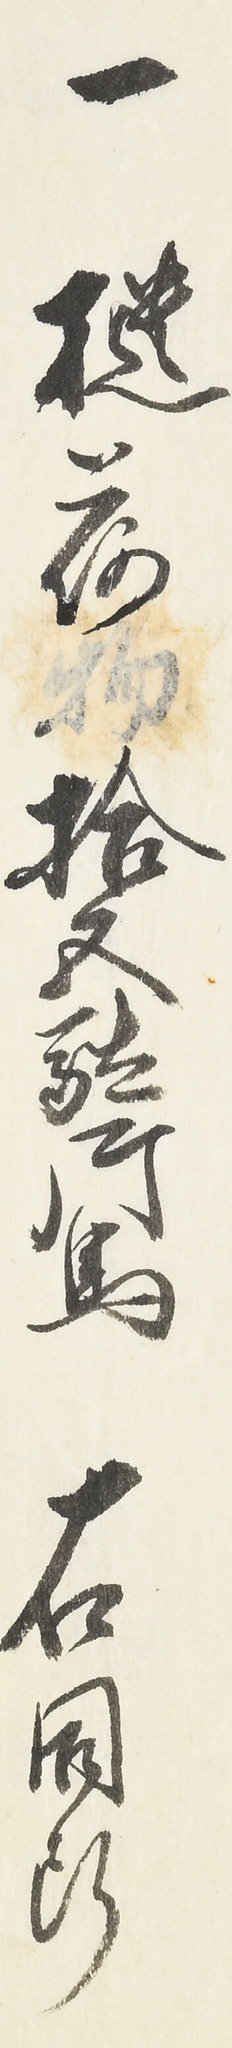一擿荷拾五駄片馬右同断
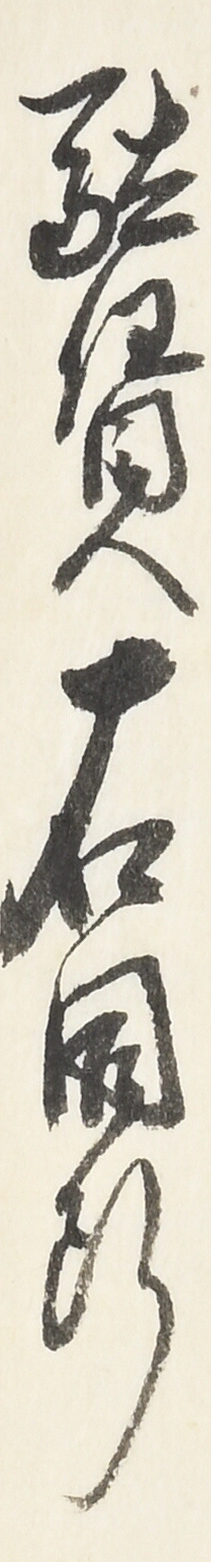駄賃右同断

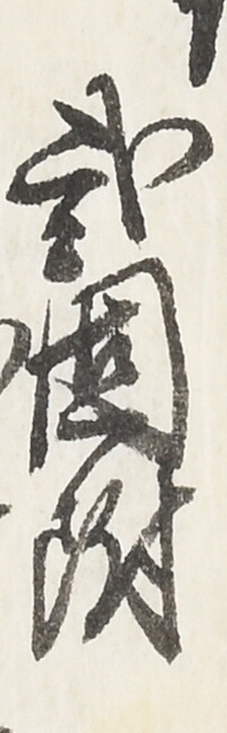弐固附
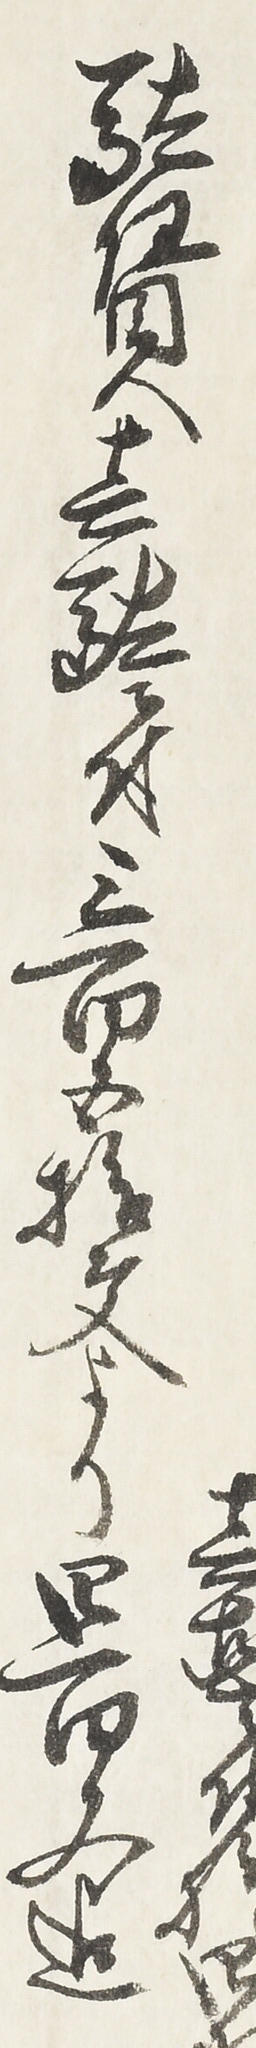駄賃壱駄ニ付三百五拾文より四百文迄
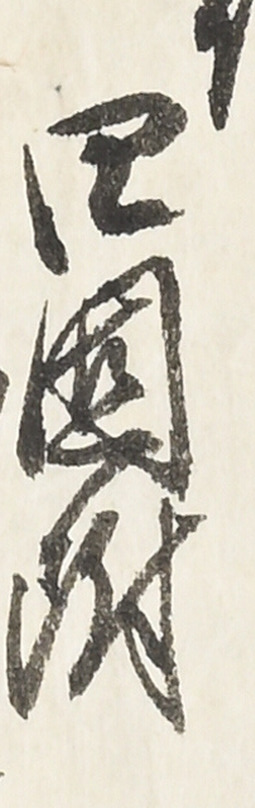四固附
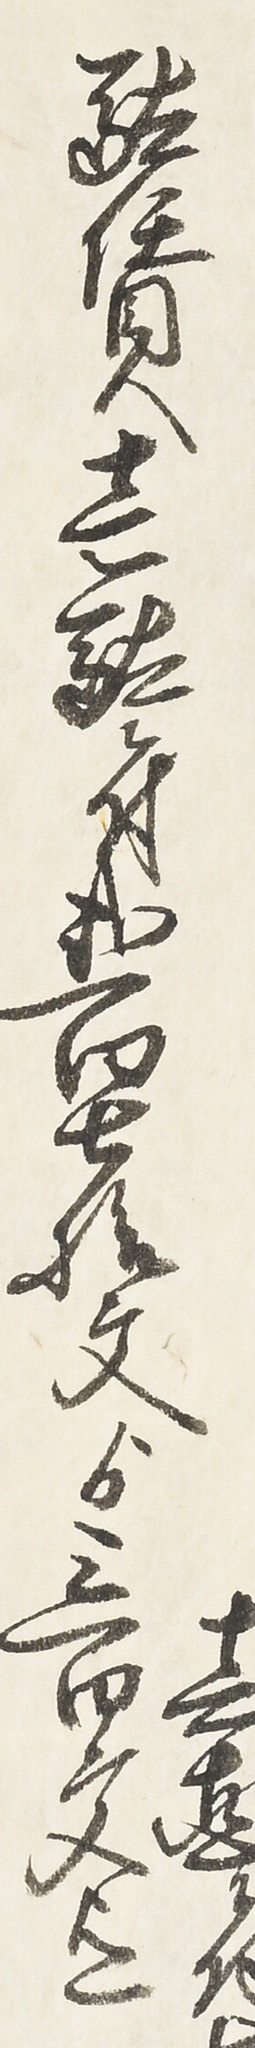駄賃壱駄ニ付弐百七拾文ゟ三百文迄
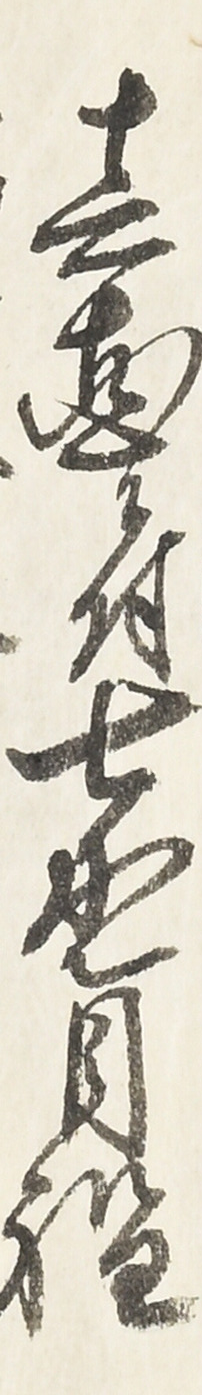壱固ニ付七貫目程
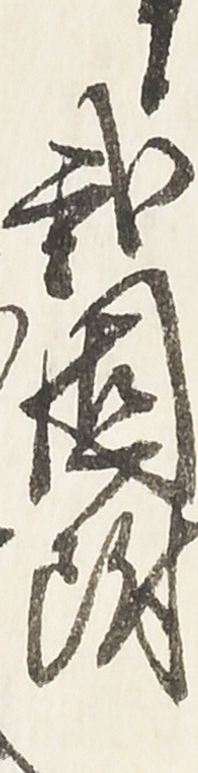弐固附
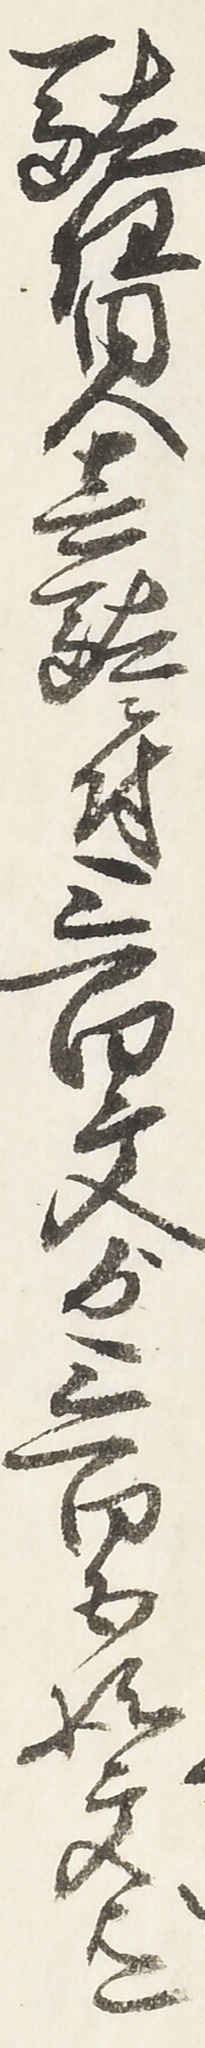駄賃壱駄ニ付三百文ゟ三百五拾文迄
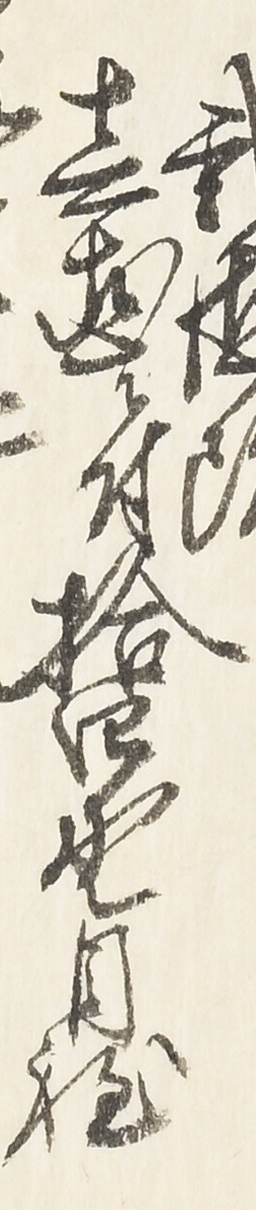壱固ニ付拾四貫目程
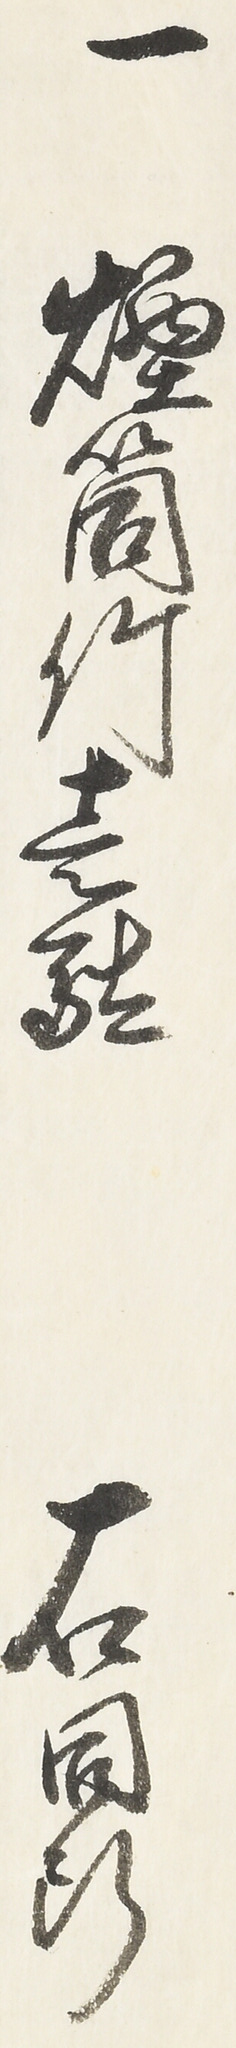一煙箇竹壱駄右同断
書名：中馬ニテ附通候出入荷物目録帳
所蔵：伊那市立高遠町図書館・合同会社AMANE
